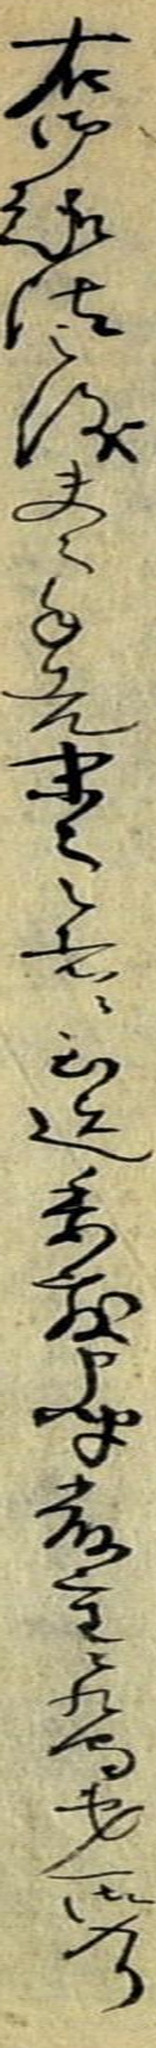右御趣法之儀夫々手先末々之者ニ至迄委敷申聞厳重ニ相守第一御〆り
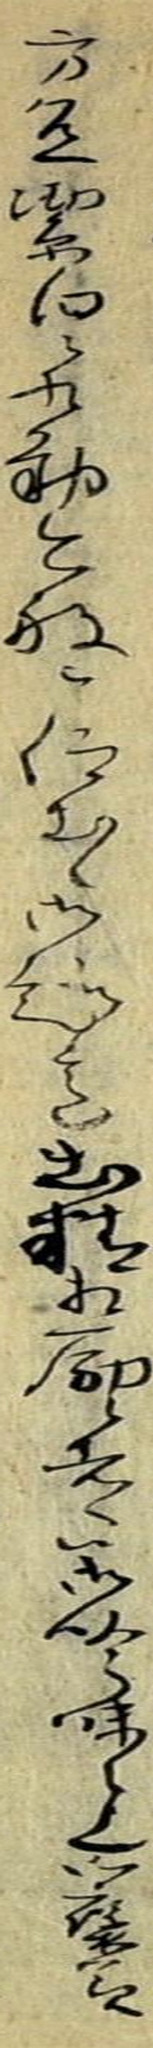方宜潔白ニ相勤今般被仰出候御趣意出精相励候者へハ御吟味之上御褒美
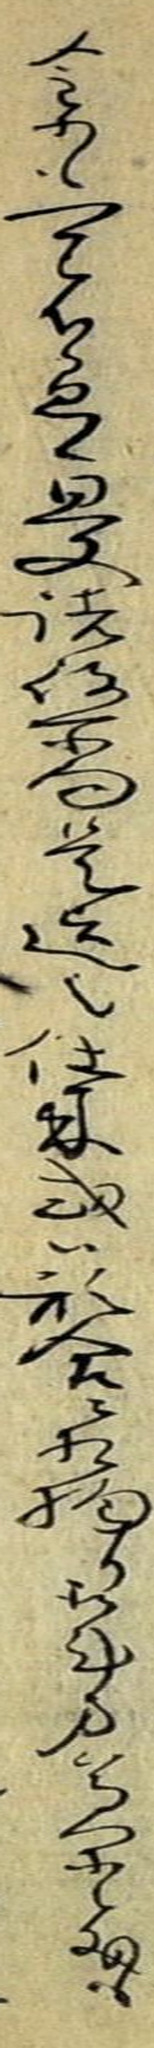金子も可被下置候且又諸役諸向是迄之仕来或ハ形合ニ相拘り取計方等閑候義も
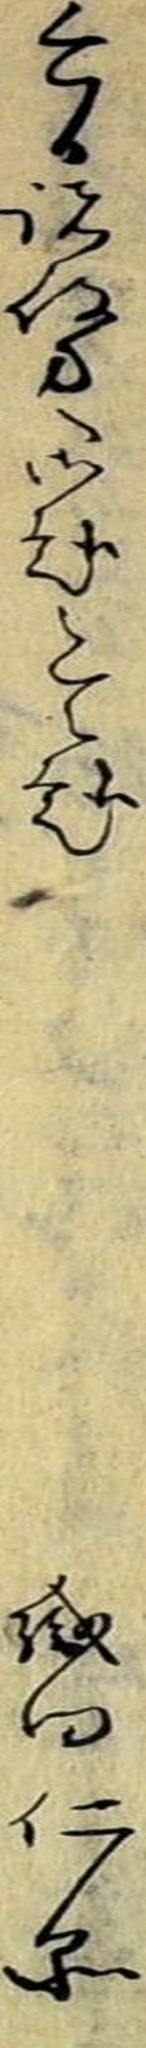〇今日諸役方へ御趣意之趣織田仁兵衛
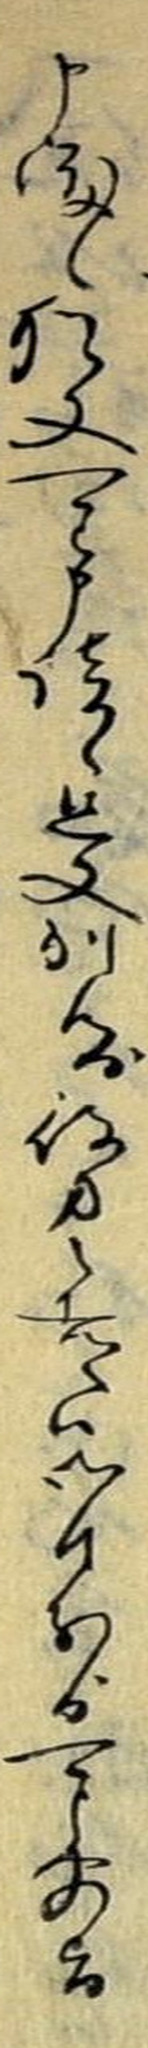申渡候猶又可被申談候且又別紙役之方之者ヘハ御自分ゟ可申聞旨
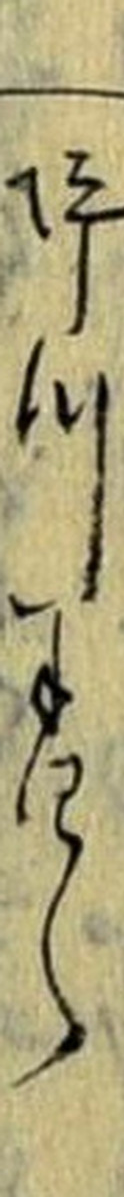坪川半四郎
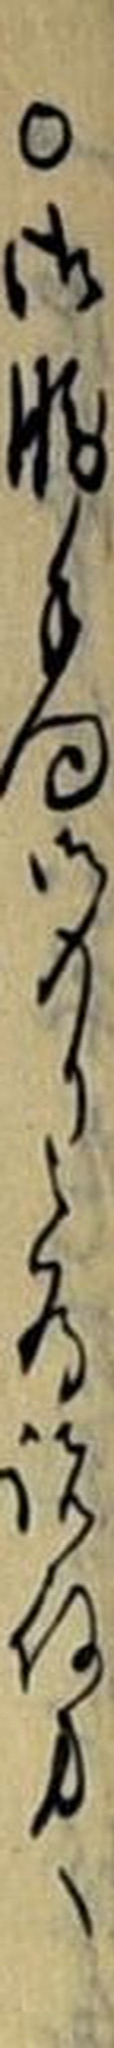〇御勝手向御〆り被為諸役方へ
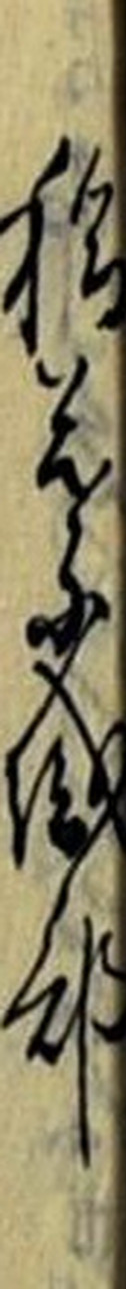稲葉織部
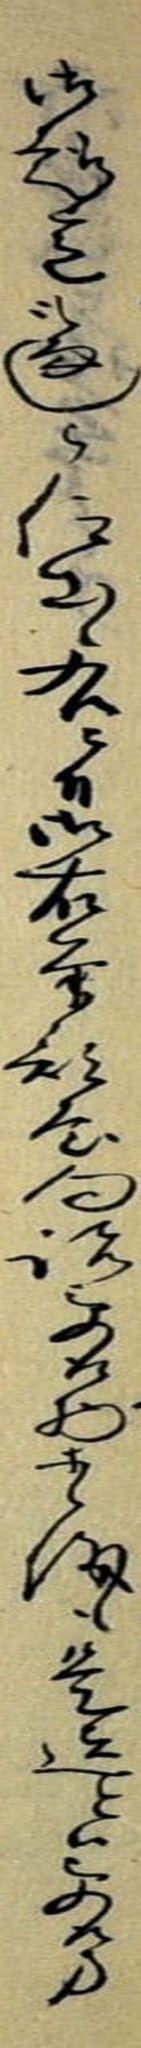御趣意之通被仰出候右ニ付御右筆部屋向諸受取物等之儀も是迄とハ受取方
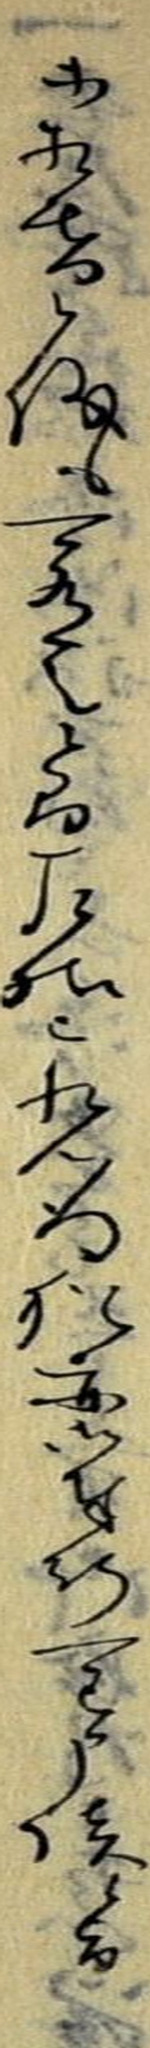等相替候儀も可有之候間左様被相心得猶亦御奉行可被申談候旨
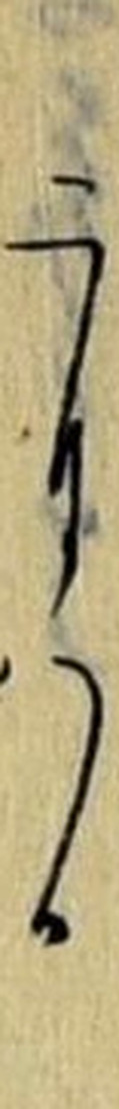二月八日
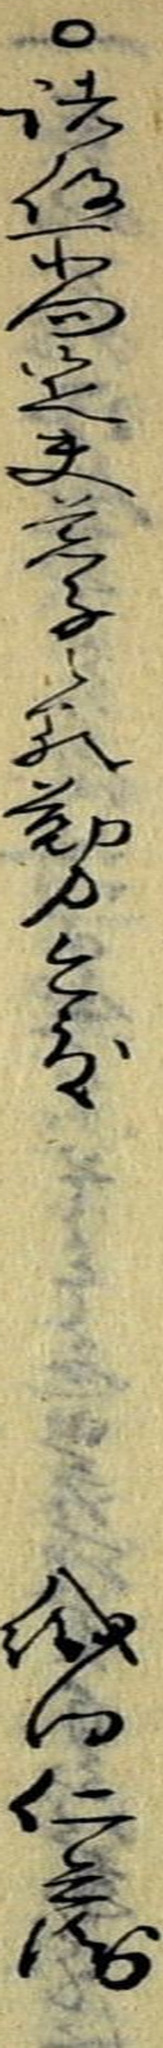〇諸役諸向定夫荒子之類勤方今度織田仁兵衛
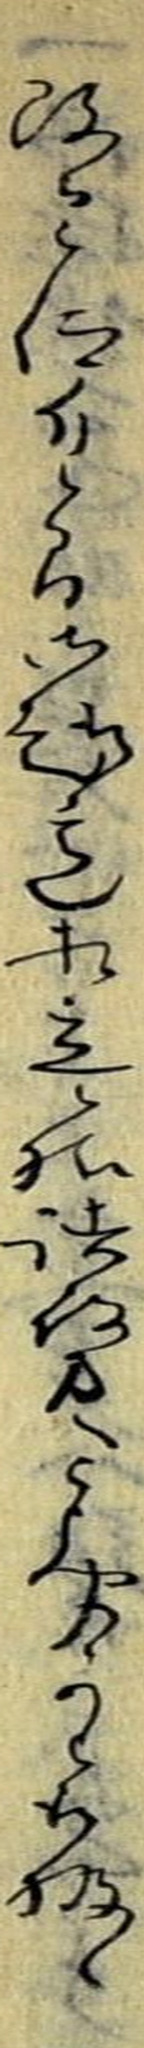改而被仰付候間御趣意相立候様諸役方へ被申聞可被取扱候
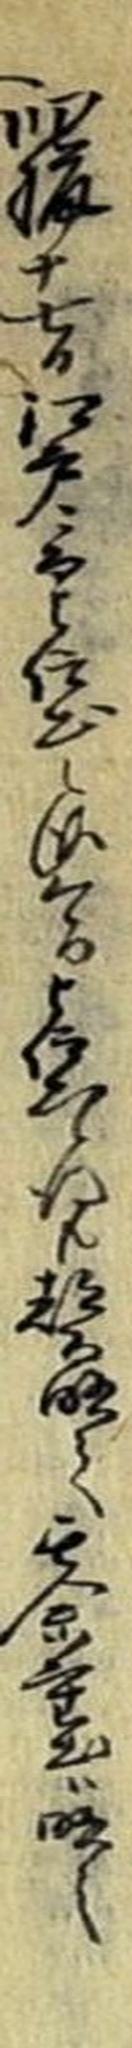―旧臘十七日江戸ニ而被仰出候趣今日被仰出候得共都而略之其余重出ハ略之
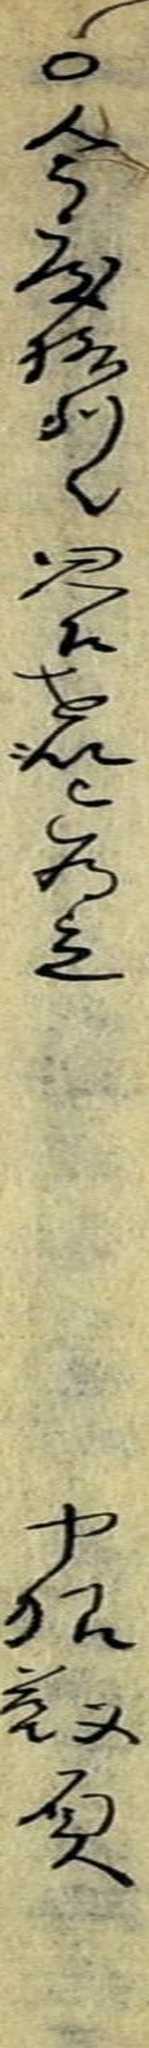〇今度格別之思召を以被為立中根靱負
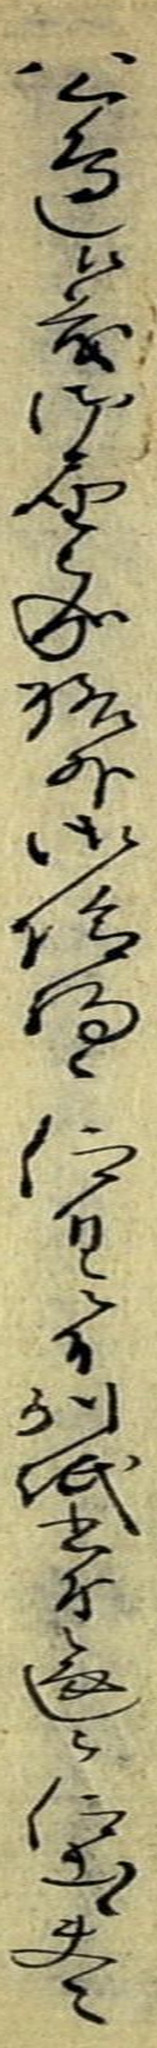公辺江茂御届被成格外御倹約被仰付候ニ付別紙書付之通被仰出候夫々
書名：命令之部 三
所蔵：福井県文書館 Fukui Prefectural Archives
